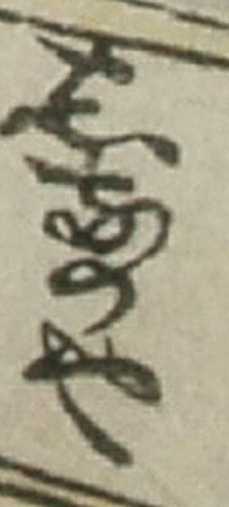しなのや
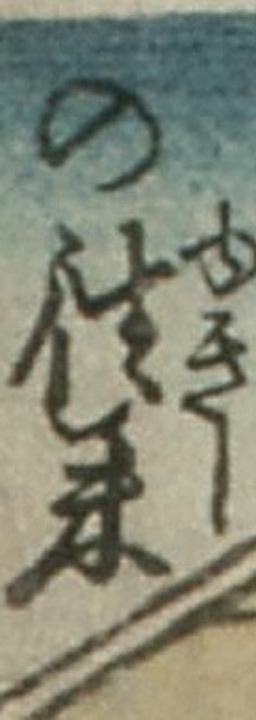の往来
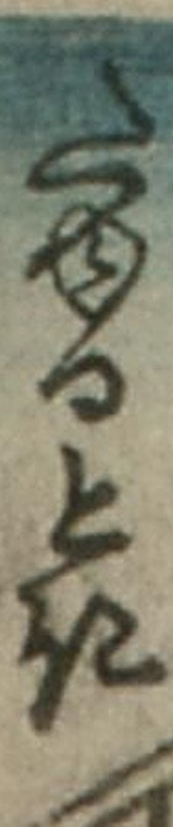たまるとき
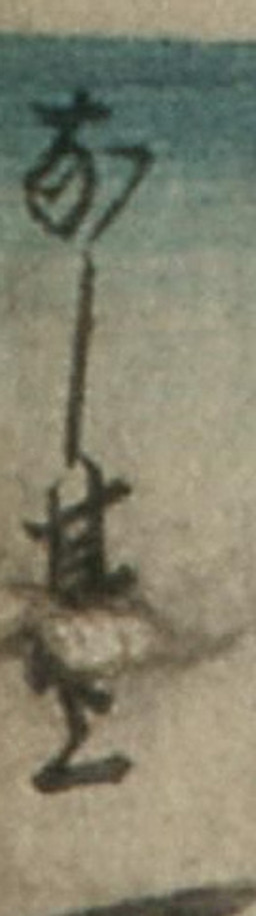なし其上
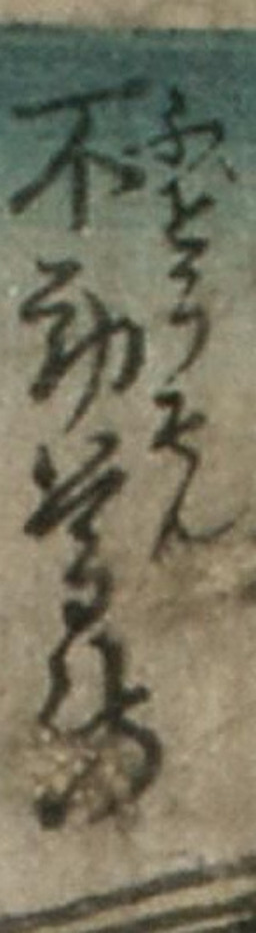不動尊坊
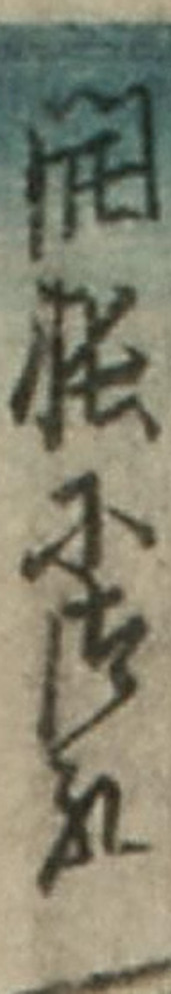開帳に御礼
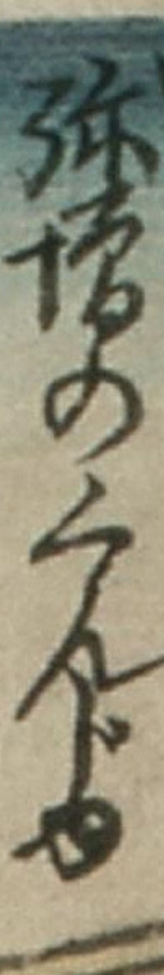弥増のくんじゆ
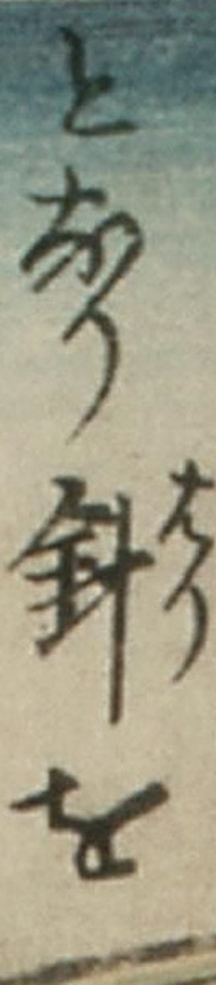となり針を
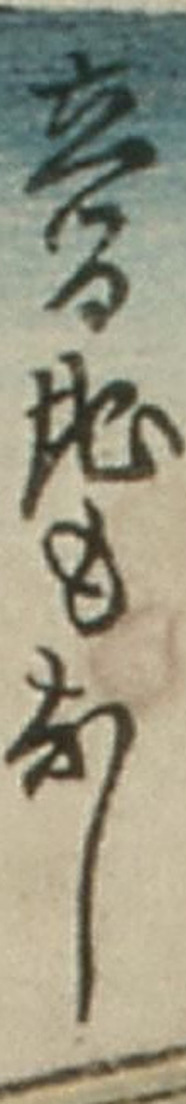立る地もなし
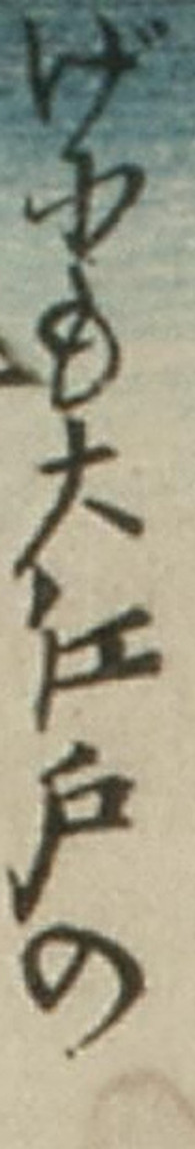げにも大江戸の
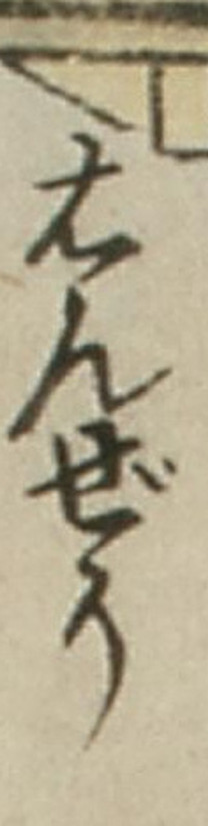はんぜう
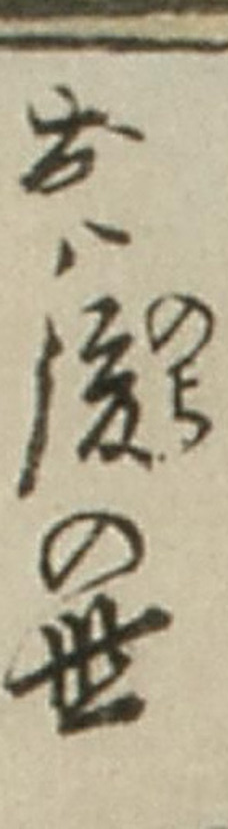おは後の世
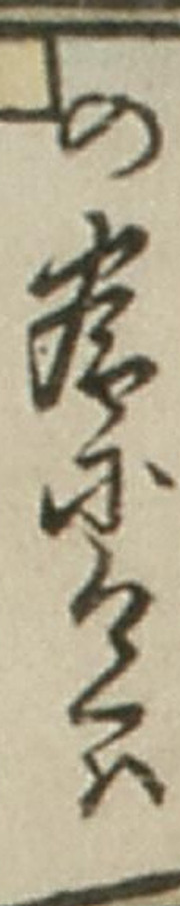の為にかくは
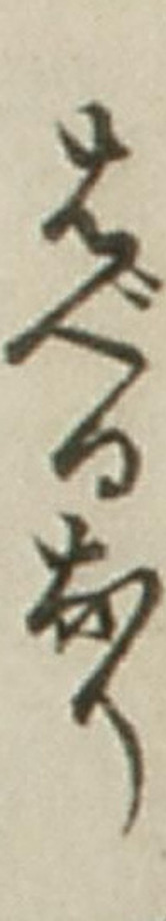はべるなり

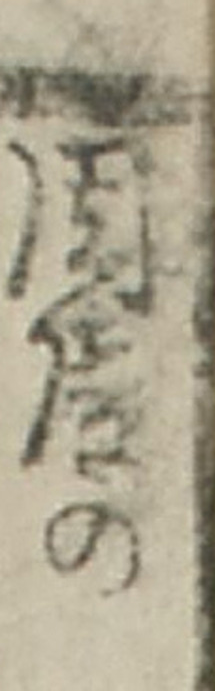周障の
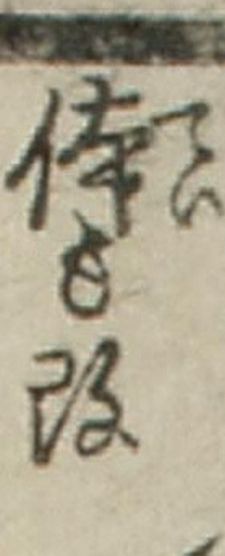体も改
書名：安政見聞誌　上
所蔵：東京大学地震研究所図書室 Earthquake Research Institute Library, The University of Tokyo, JAPAN
